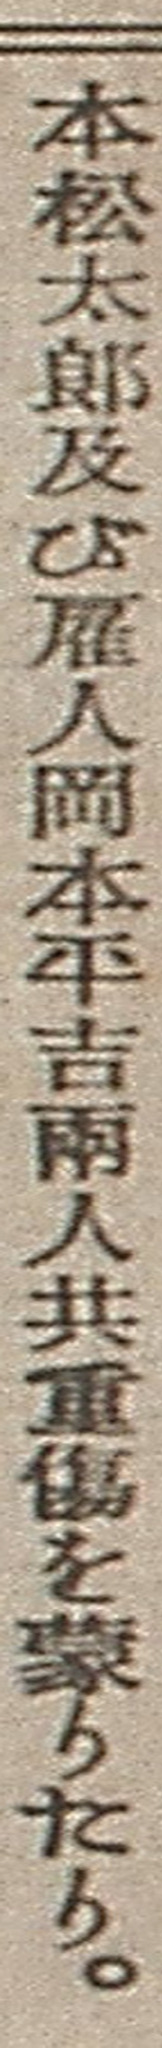本松太郎及び雇人岡本平吉両人共重傷を蒙りたり。
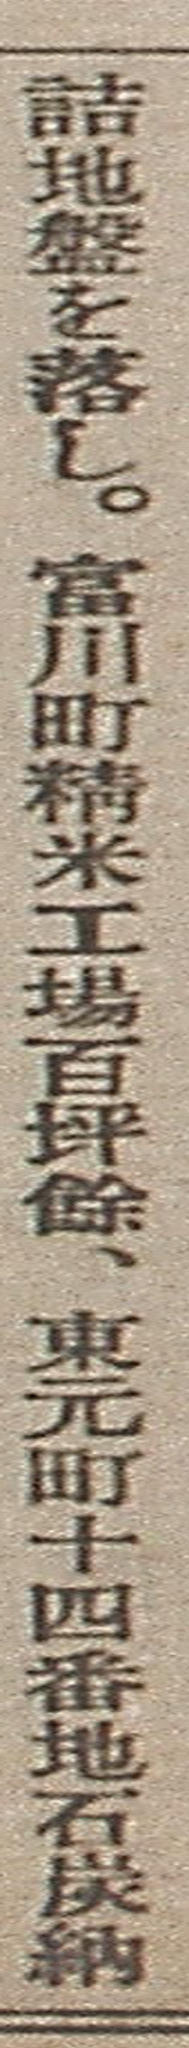詰地盤を落し。富川町精米工場百坪余、東元町十四番地石炭納
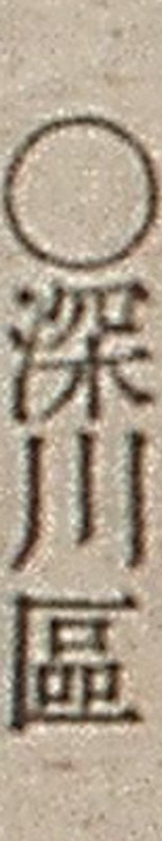〇深川区
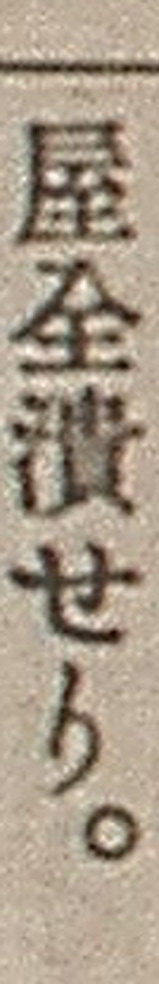屋全潰せり。
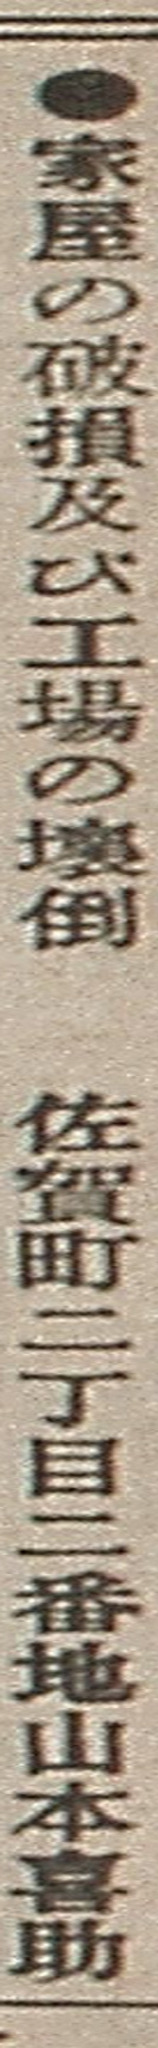●家屋の破損及び工場の壊倒佐賀町二丁目二番地山本喜助
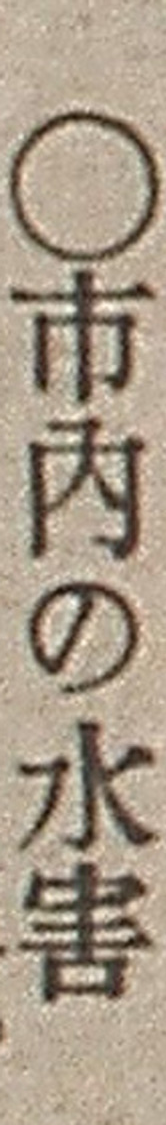〇市内の水害
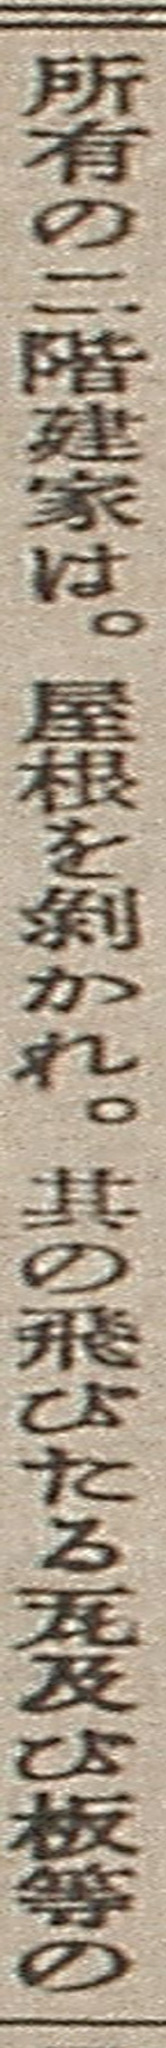所有の二階建家は。屋根を剥かれ。其の飛びたる瓦及び板等の
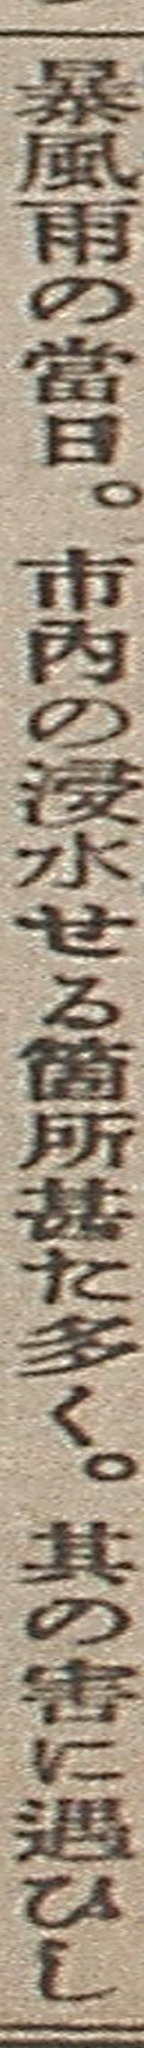暴風雨の当日。市内の浸水せる箇所甚た多く。其の害に遇ひし
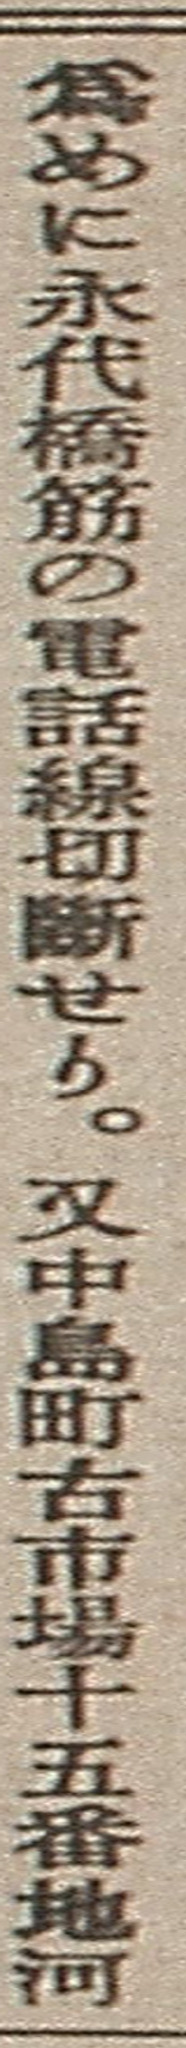為めに永代橋筋の電話線切断せり。又中島町古市場十五番地河
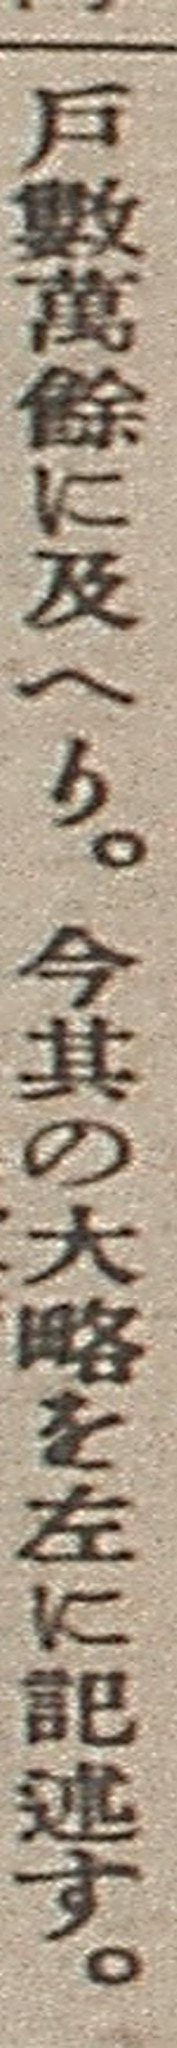戸数万余に及へり。今其の大略を左に記述す。
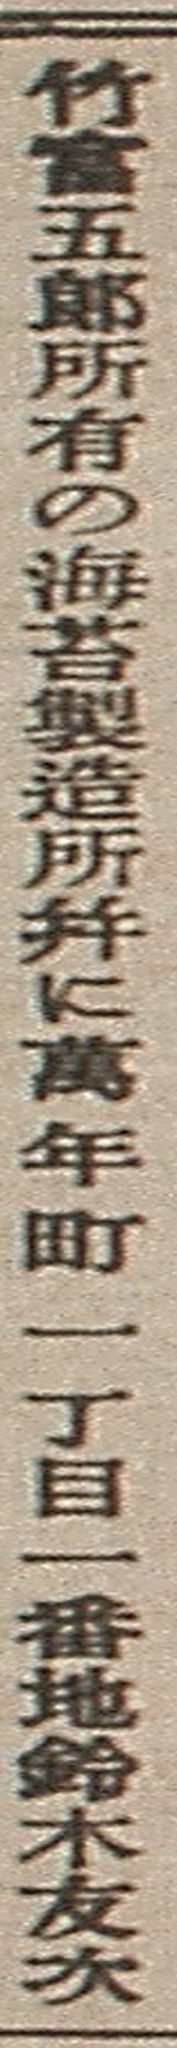竹富五郎所有の海苔製造所并萬年町一丁目一番地鈴木友次
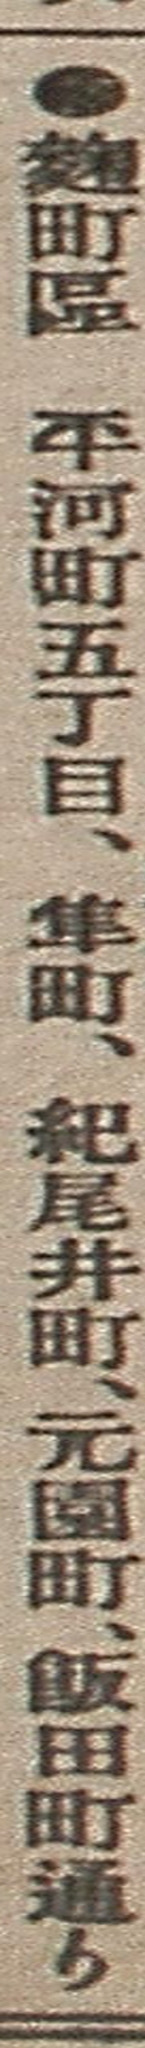●麹町区平河町五丁目、隼町、紀尾井町、元園町、飯田町通り

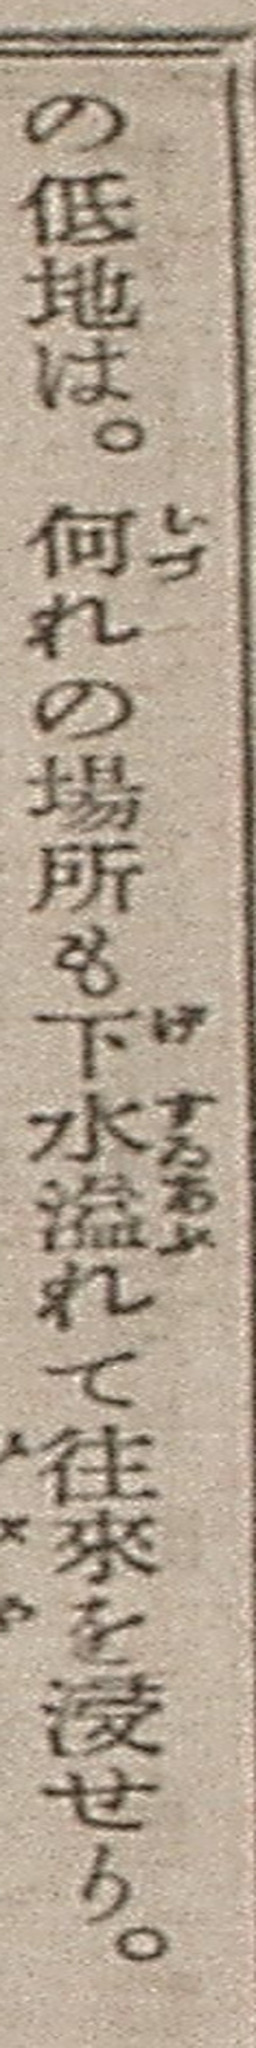の低地は。何れの場所も下水溢れて往来を浸せり。
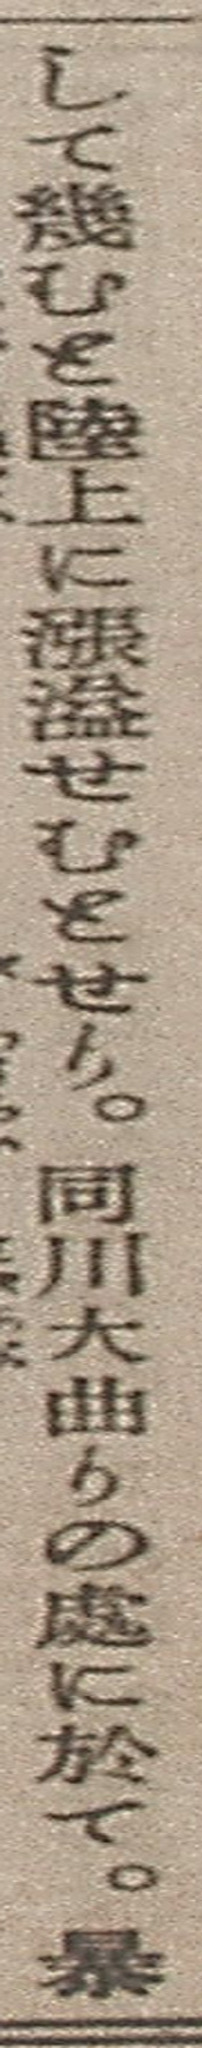して幾むと陸上に漲溢せむとせり。同川大曲りの処に於て。暴
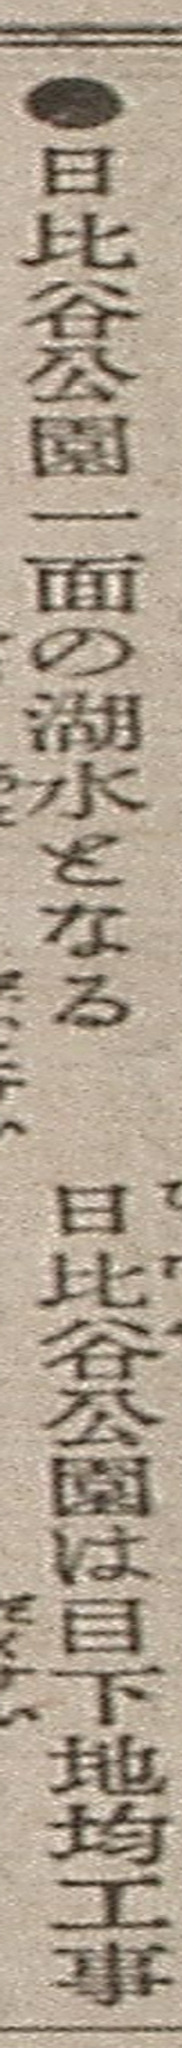●日比谷公園一面の湖水となる日比谷公園は目下地均工事
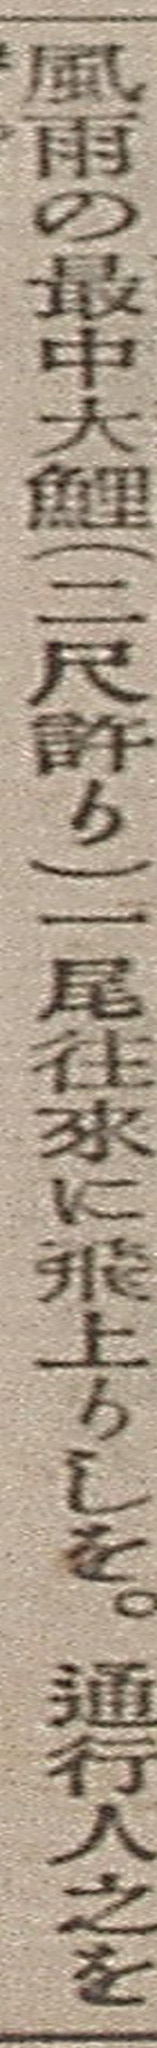風雨の最中大鯉一尾往来に飛上りしを。通行人之を
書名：風俗畫報臨時増刊第百九十九號　明治三十二年十月各地災害圖會（前編之續）
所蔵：東京大学地震研究所図書室 Earthquake Research Institute Library, The University of Tokyo, JAPAN
